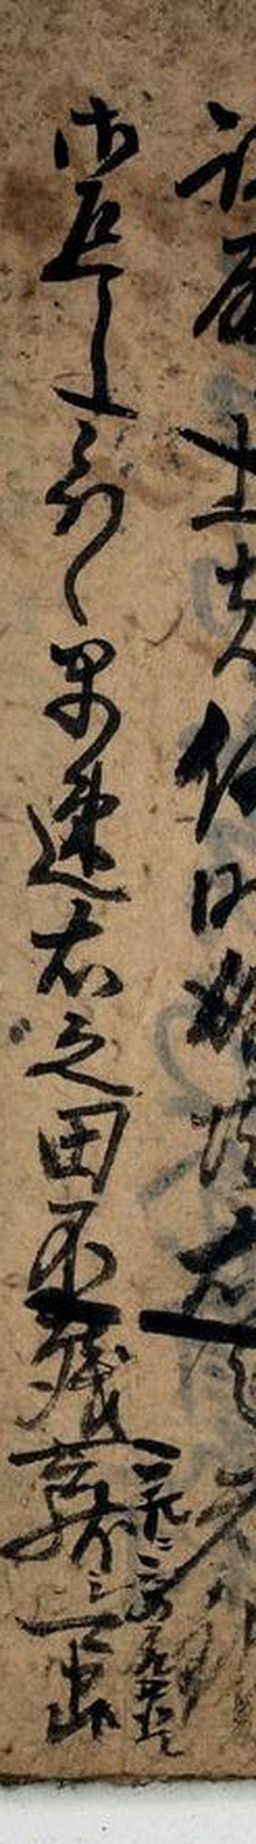御返し候ハヽ早速右之田不残戻シ可申候
